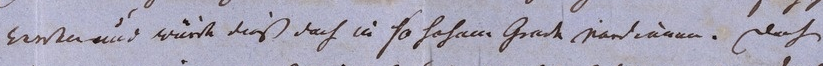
werden und würde dieß doch in so hohem Grade verdienen. Doch
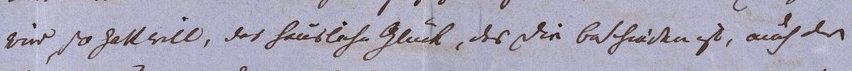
wird, so Gott will, das häusliche Glück, das Dir beschieden ist, auch das
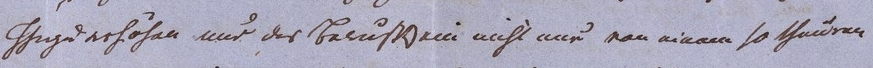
Ihrige erhöhen und das Bewußtsein nicht nur von einem so theuren
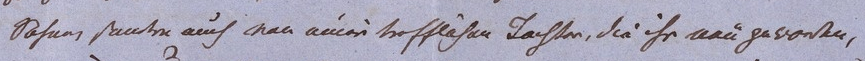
Sohne, sondern auch von einer trefflichen Tochter, die ihr neu geworden,
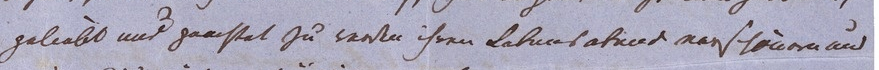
geliebt und geachtet zu werden ihren Lebensabend verschönern und
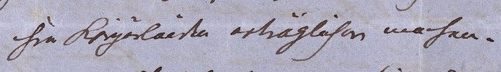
ihre Körperleiden erträglicher machen.
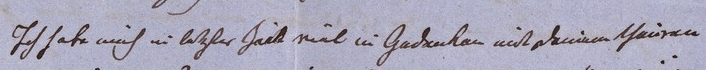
Ich habe mich in letzter Zeit viel in Gedanken mit Deinem theuren
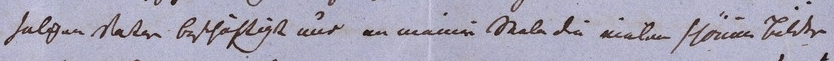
seligen Vater beschäftigt und an meiner Seele die vielen schönen Bilder
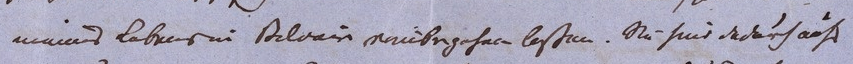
meines Lebens in Belvoir vorübergehen laßen. Sie sind dadurch aufs
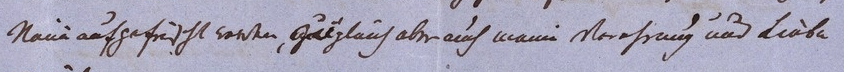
Neue aufgefrischt worden, zugleich aber auch meine Verehrung und Liebe
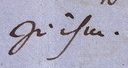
zu ihm.
